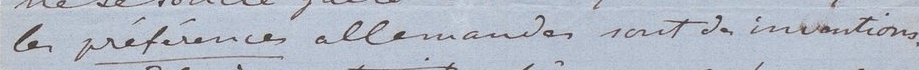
les préférencesallemandes sont des inventions.
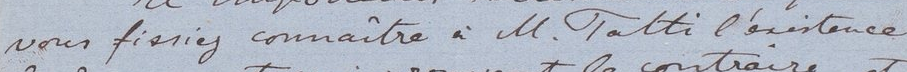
vous fissiez connaître à M. Tatti l'existence
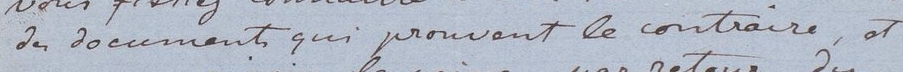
des documents qui prouvent le contraire, et
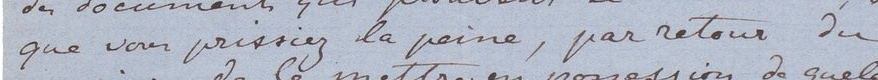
que vous prissiez la peine, par retour du
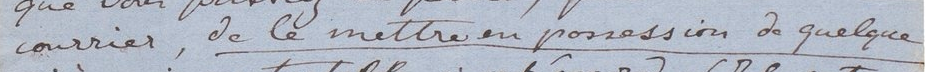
courrier, de le mettre en possession de quelque
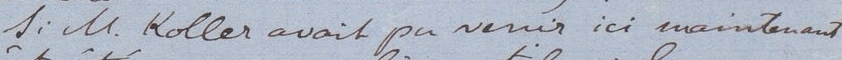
Si M. Koller avait pu venir ici maintenant
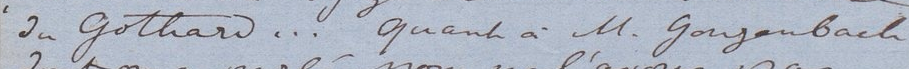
du Gothard... Quant à M. Gonzenbach
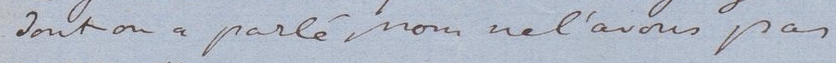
dont on a parlé nous ne l'avons pas
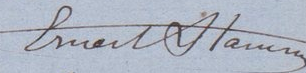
Ernest Stamm
